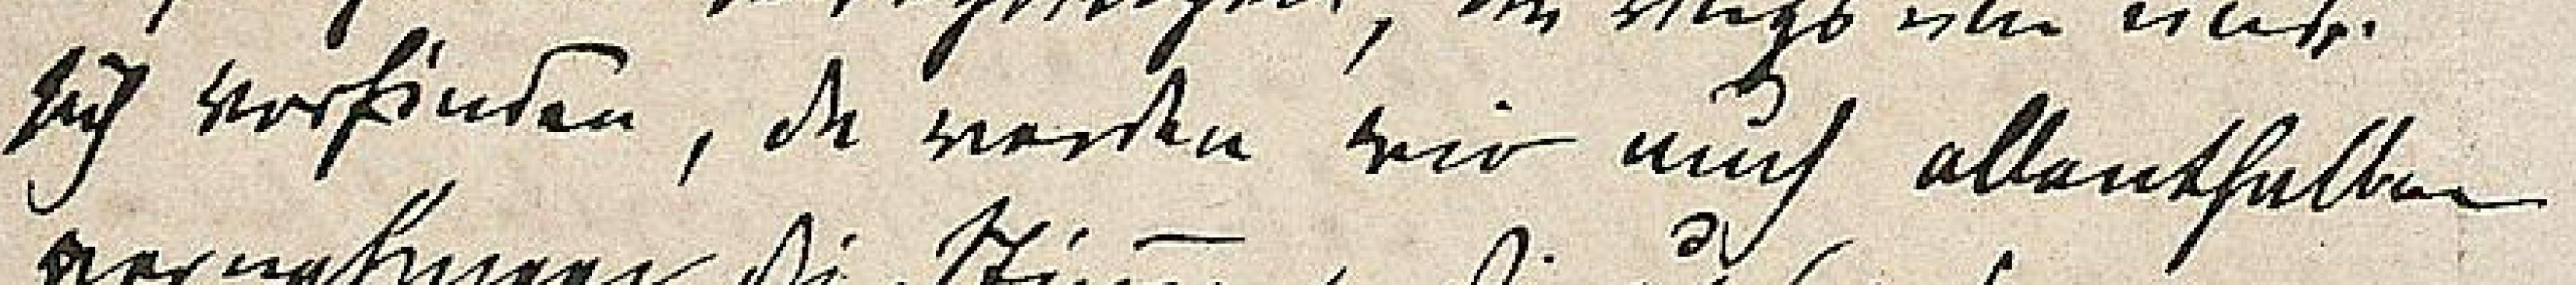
sich vorfinden, da werden wir auch allenthalben
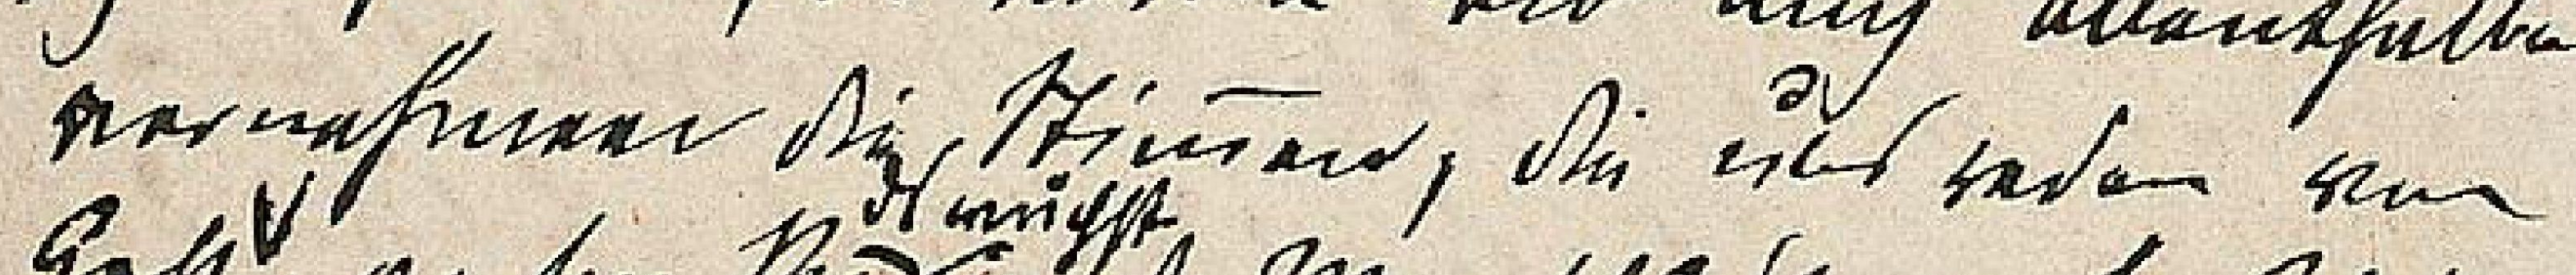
vernehmen die Stimen, die uns reden von
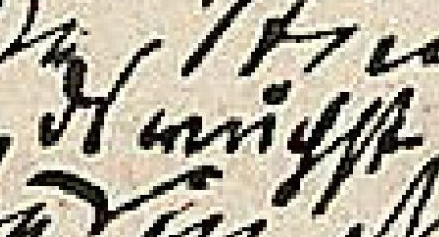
ds wächst
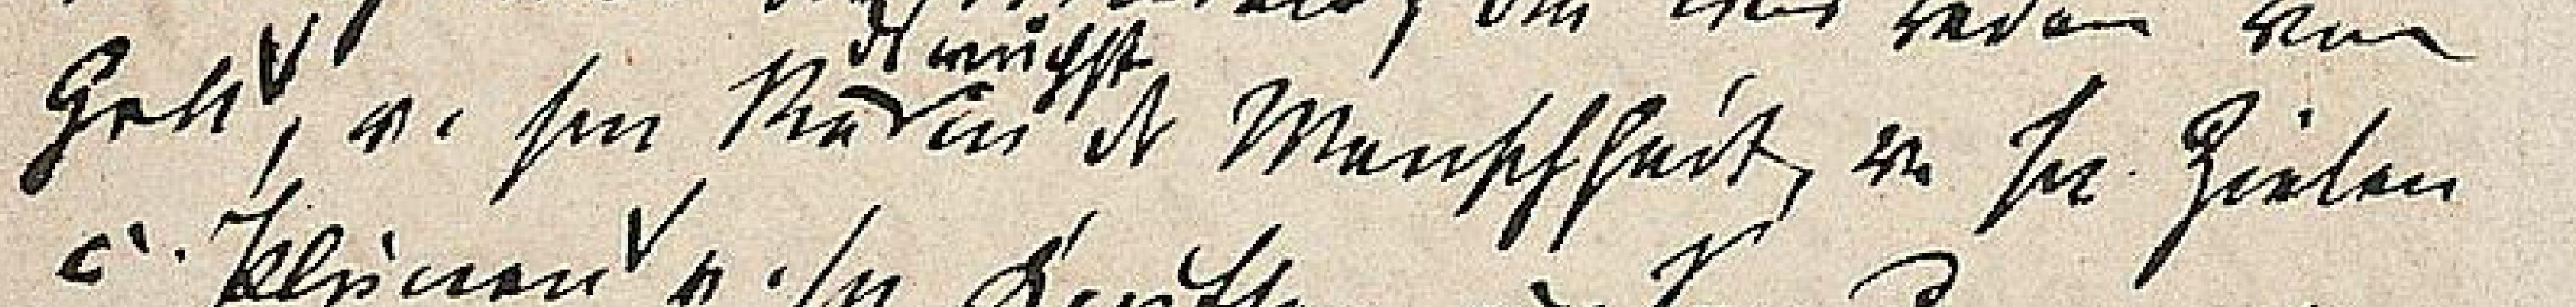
Gott, v. sm Re in der Menschheit, v. sn Zielen
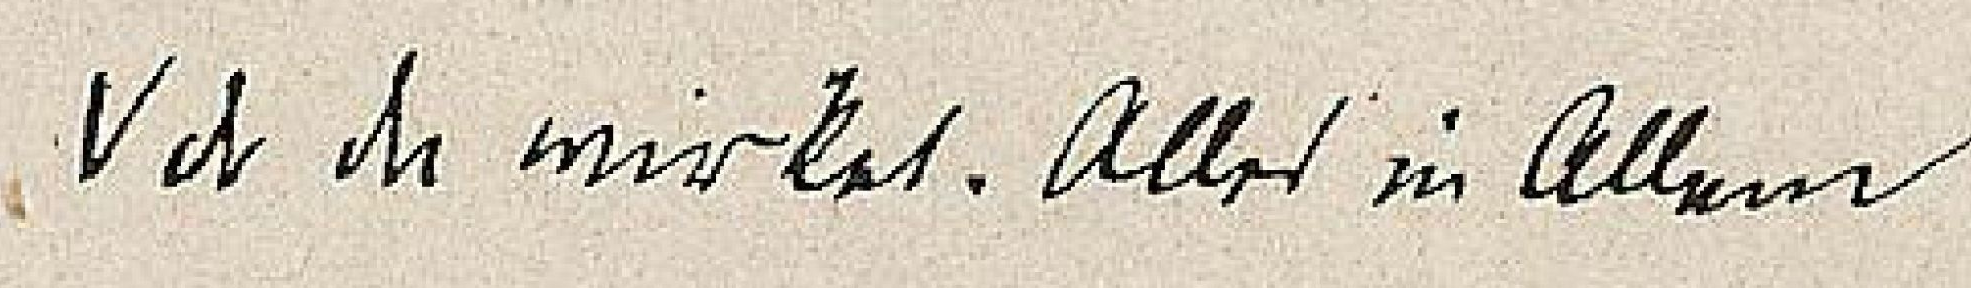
V dr da wirkt Alles in Allem
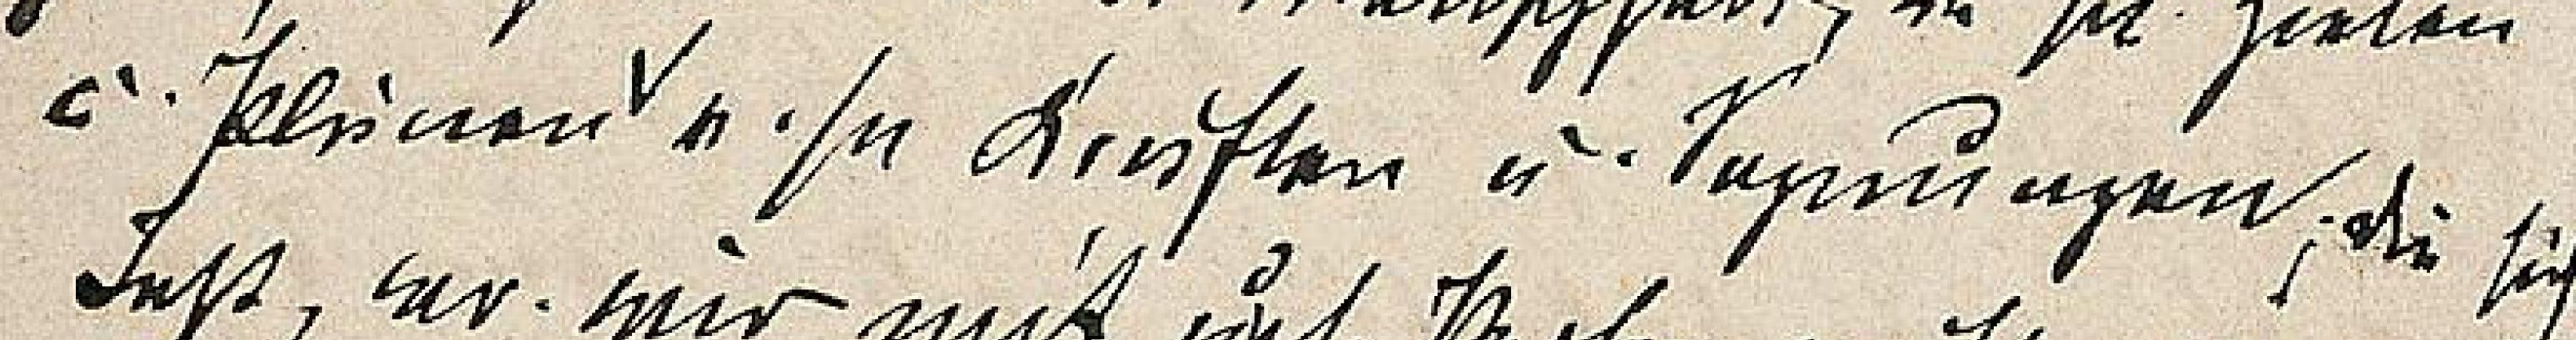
u. Plänen v. s Kräften u. Segnungen, die sich
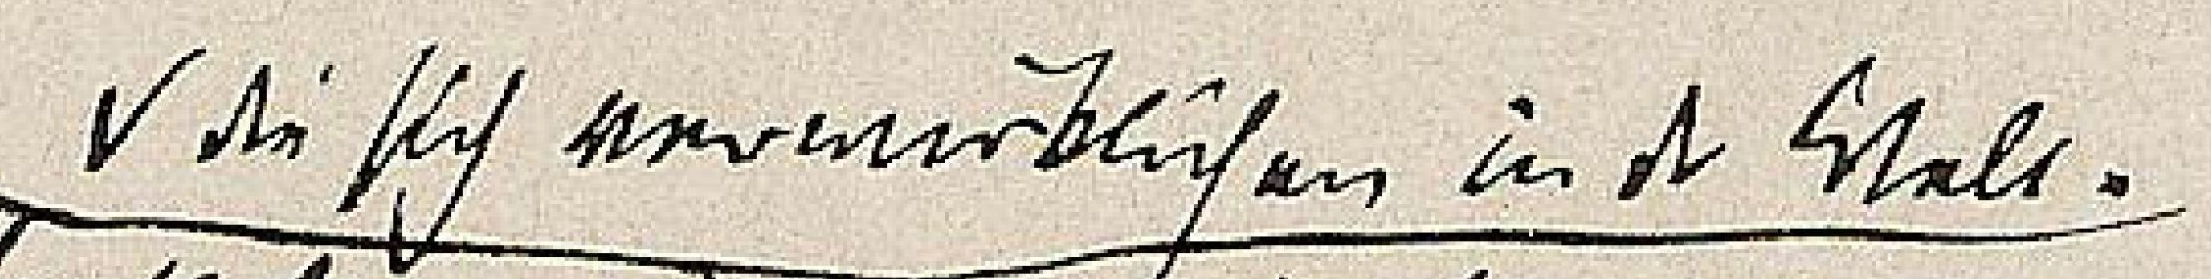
V die sich verwirklichen in der Welt.
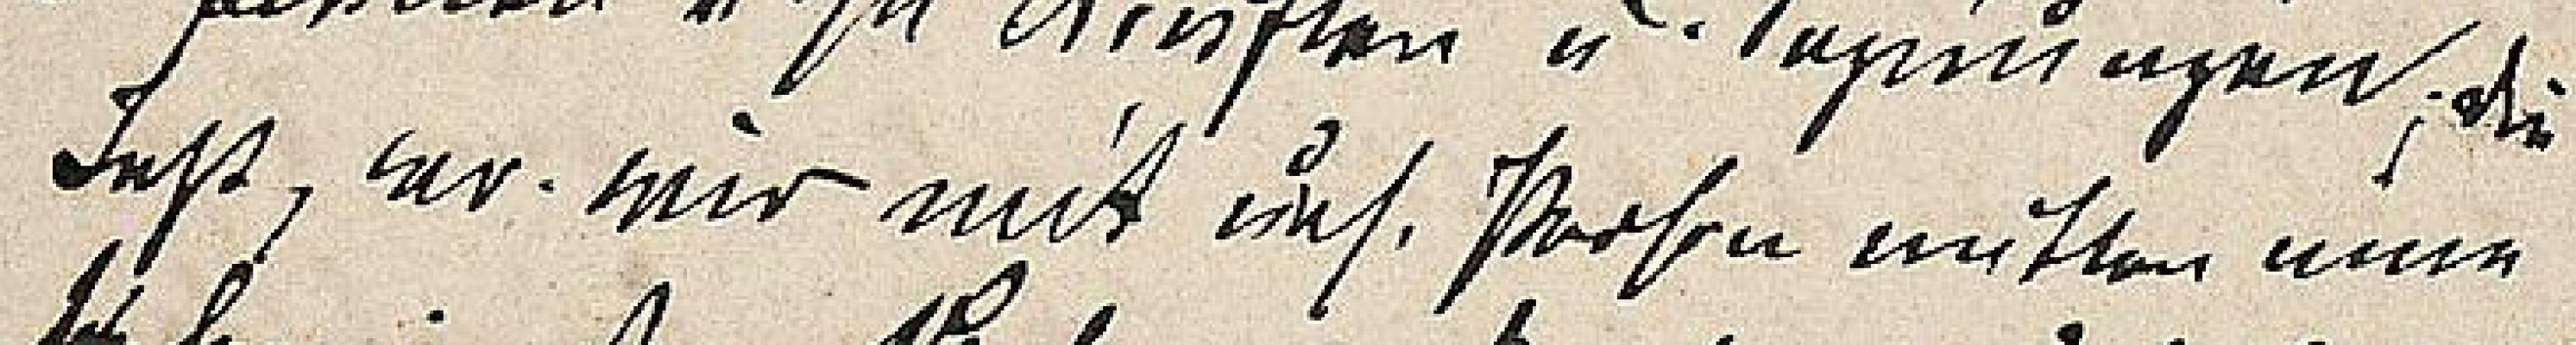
Jetzt, wo wir mit uns. Person mitten eine
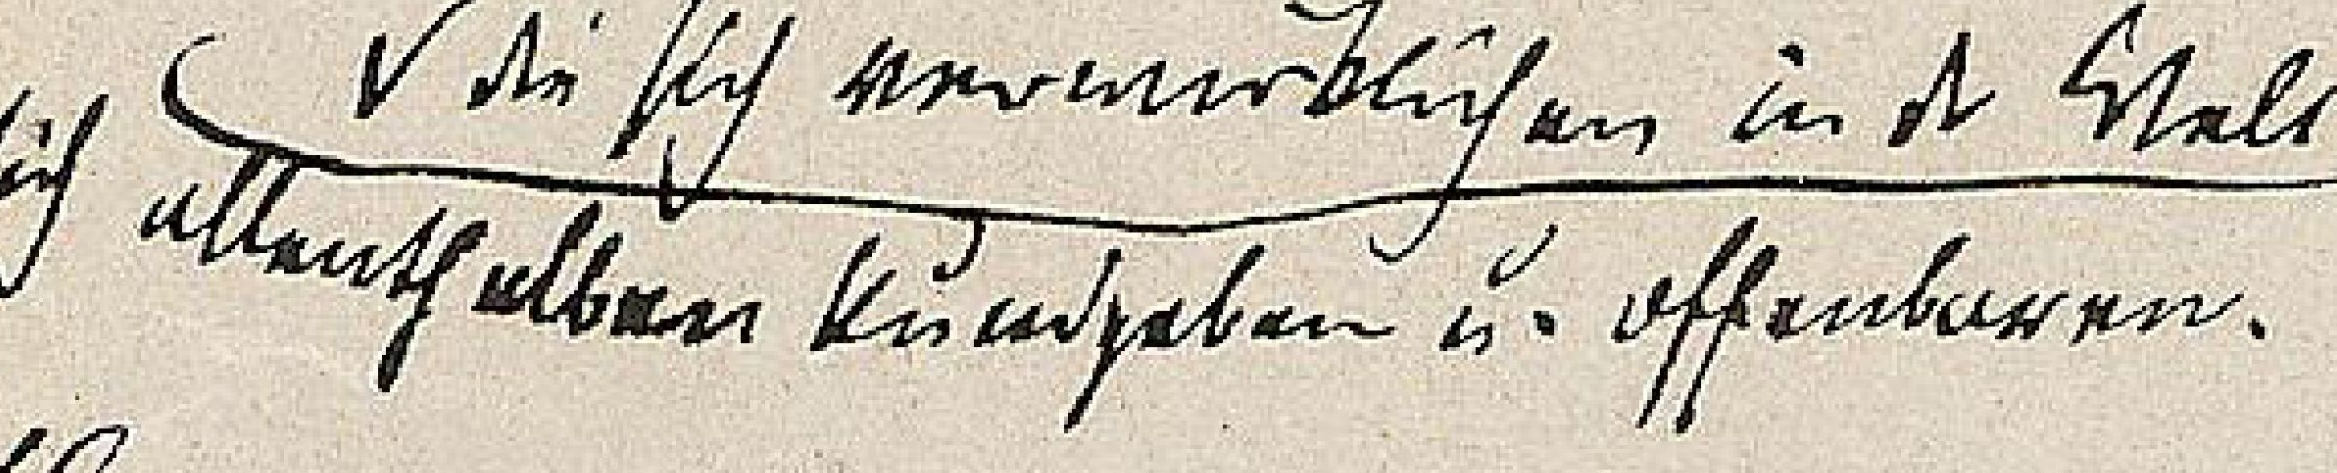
allenthalben kundgeben u. offenbaren.
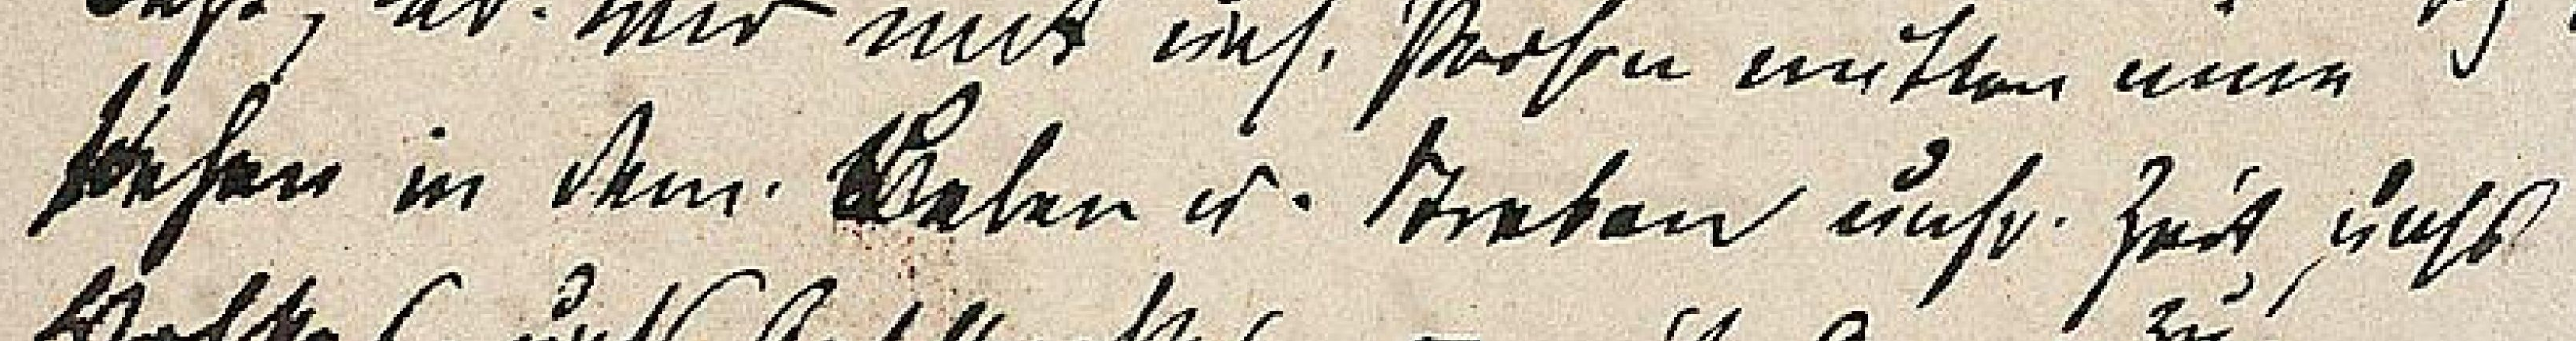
sehen in dem Leben u. Streben unsr Zeit, unss
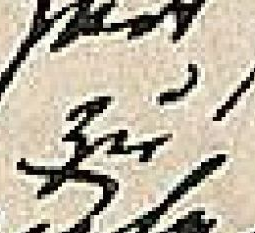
zu
